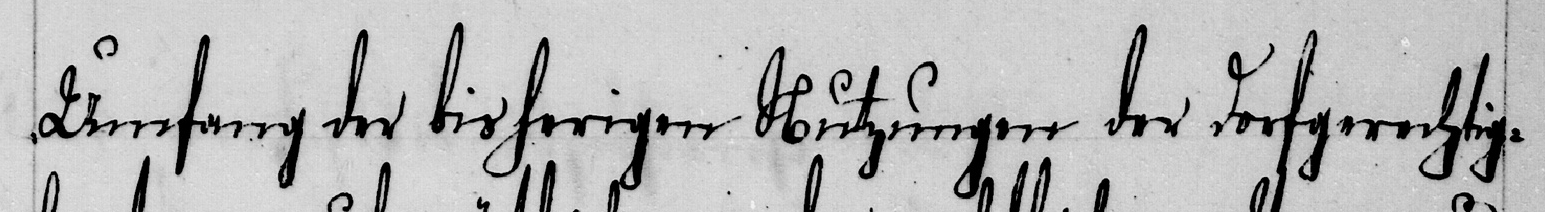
Umfang der bisherigen Nutzungen der Dorfgerechti¬
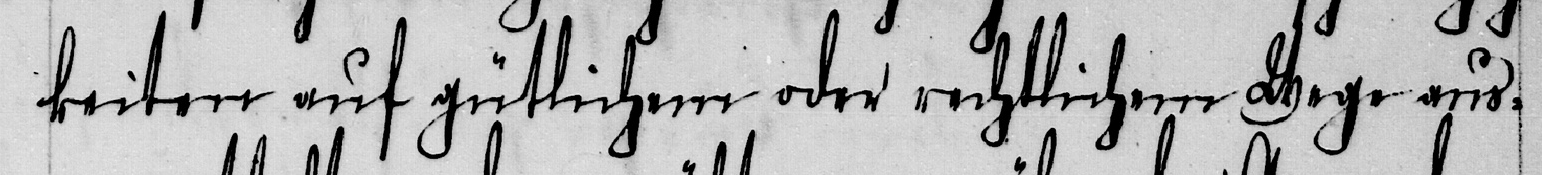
gkeiten auf gütlichem oder rechtlichem Wege aus¬
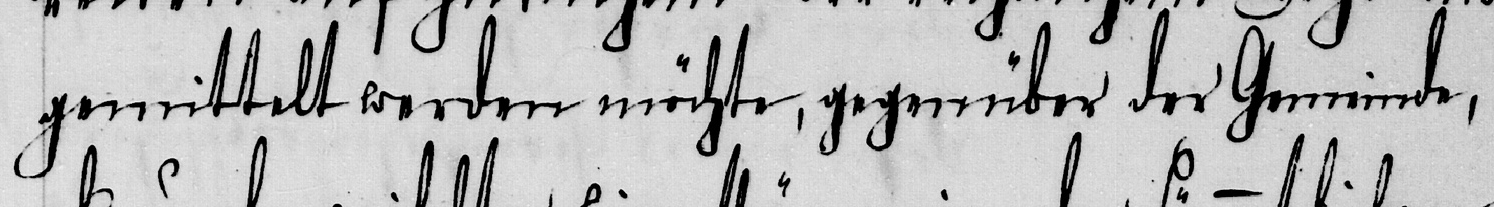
gemittelt werden möchte, gegenüber der Gemeinde,
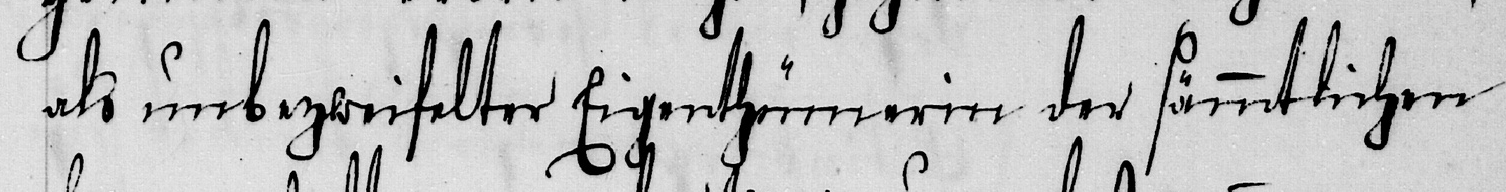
als unbezweifelter Eigenthümerin der sämmtlichen
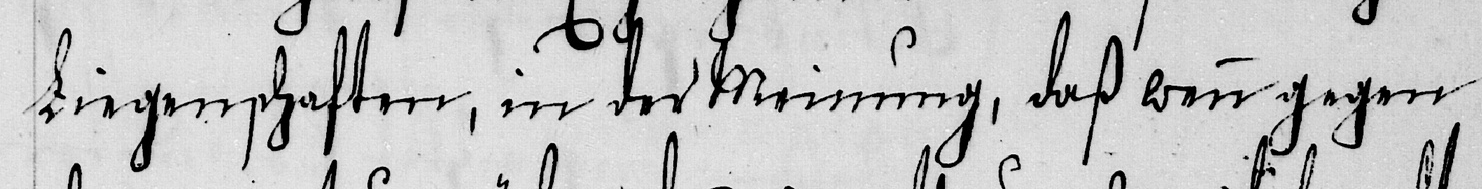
Liegenschaften, in der Meinung, daß wenn gegen
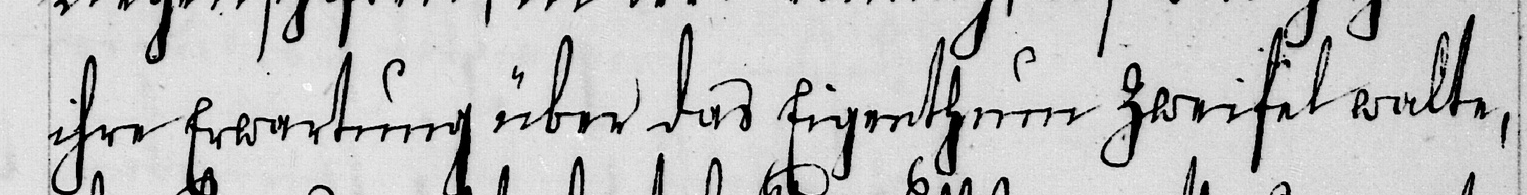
ihre Erwartung über das Eigenthum Zweifel walte,
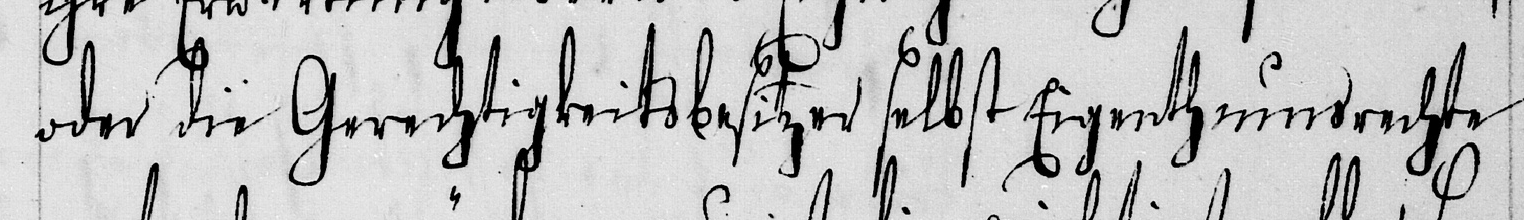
oder die Gerechtigkeitsbesitzer selbst Eigenthumsrechte
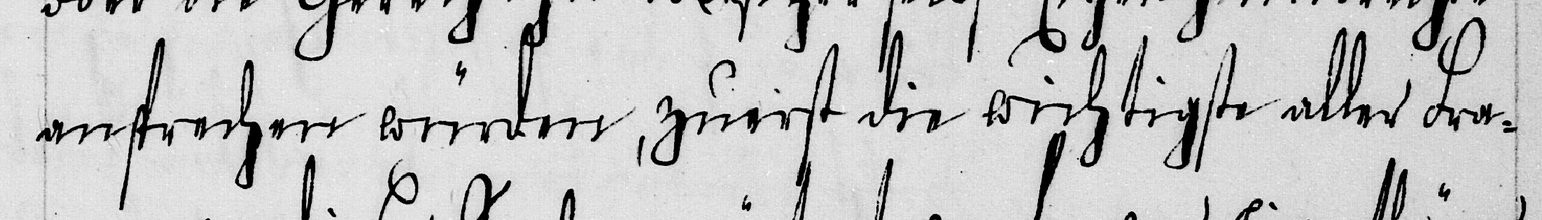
ansprechen würden, zuerst die wichtigste aller Fra¬
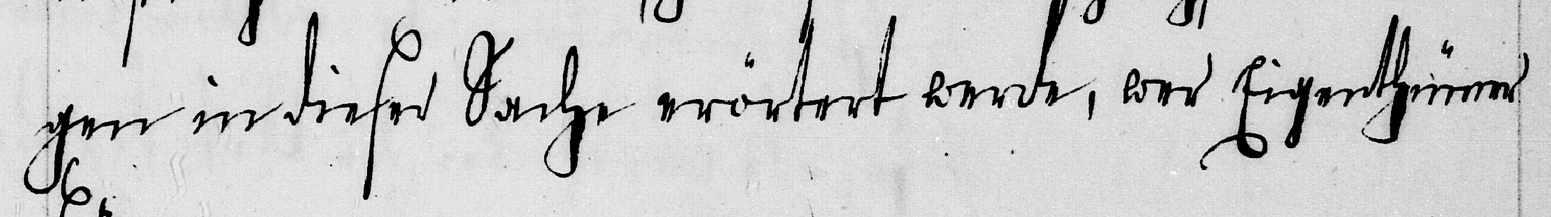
gen in dieser Sache erörtert werde, wer Eigenthümer
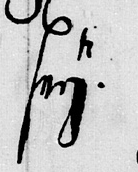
sey.
